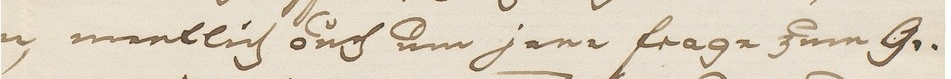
mentlich auch um jene Frage zum Ge-
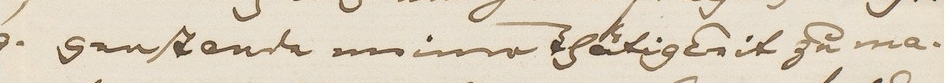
genstande meiner Thätigkeit zu ma-
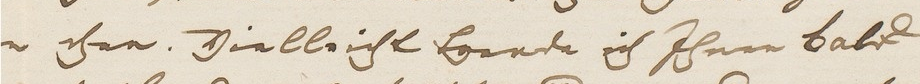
chen. Vielleicht werde ich Ihnen bald
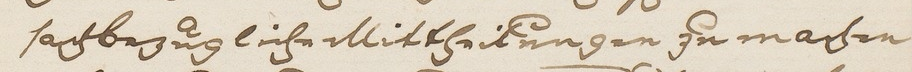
sachbezügliche Mittheilungen zu machen
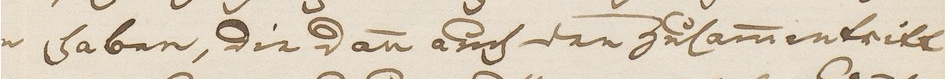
haben, die dann auch den Zusammentritt
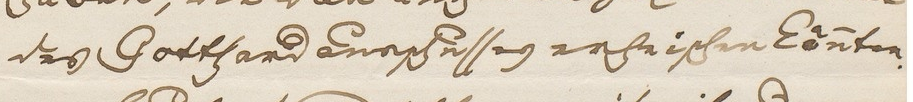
des Gotthardausschusses erheischen könnten.
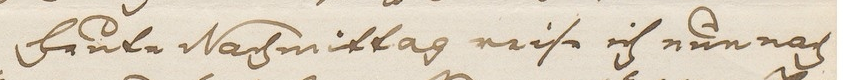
Heute Nachmittag reise ich nun nach
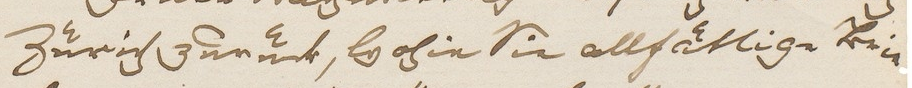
Zürich zurück, wohin Sie allfällige Brie-
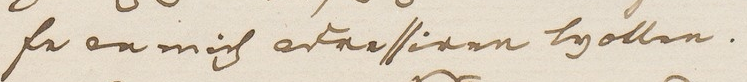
fe an mich adressiren wollen.
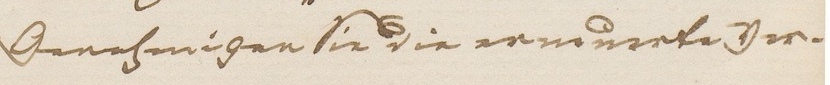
Genehmigen Sie die erneuerte Ver-
